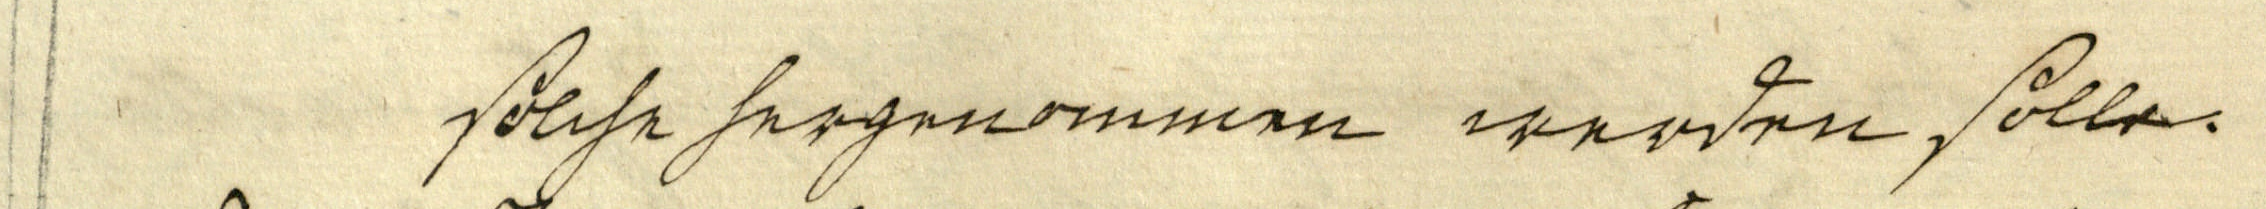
solche hergenommen werden solle.
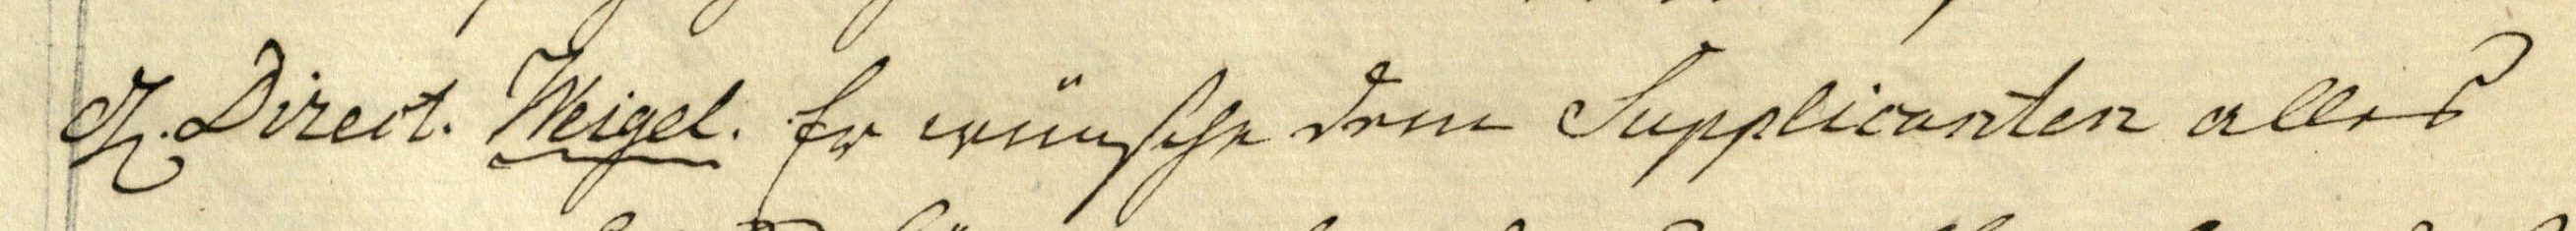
dh. Direct. Weigel. Er wünsche dem Supplicanten alles
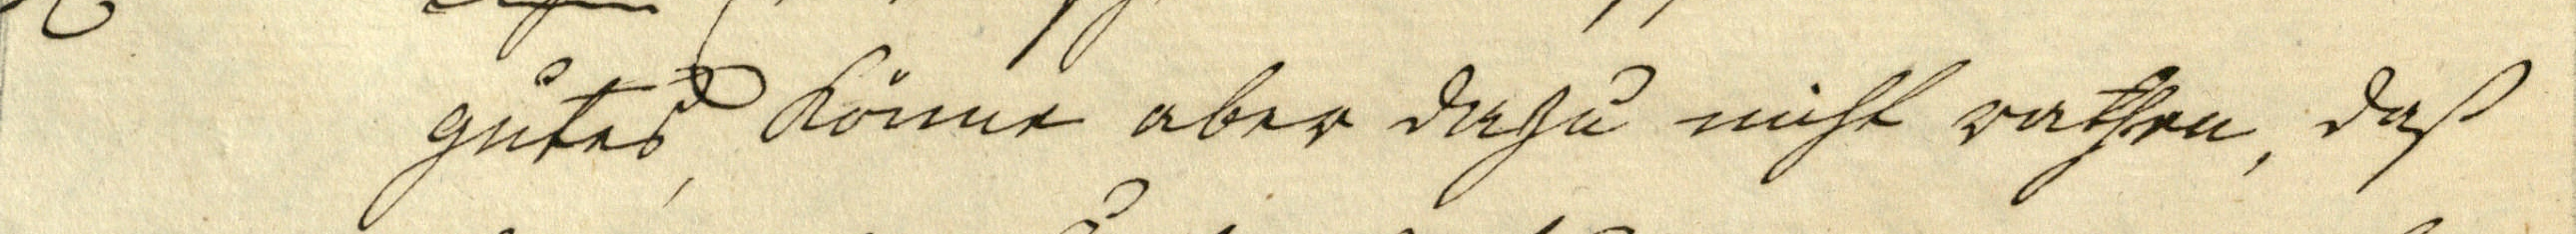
gutes, könne aber dazu nicht rathen, daß
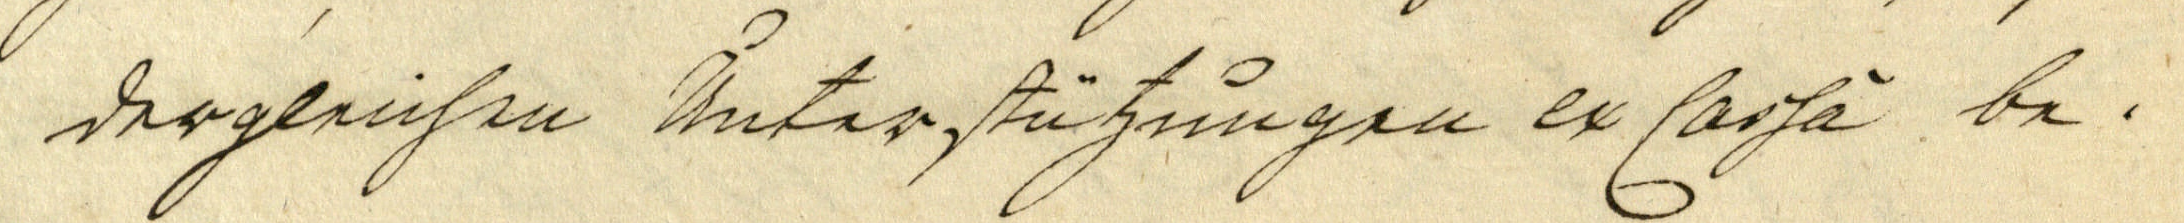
dergleichen Unterstützungen ex Cassa be-
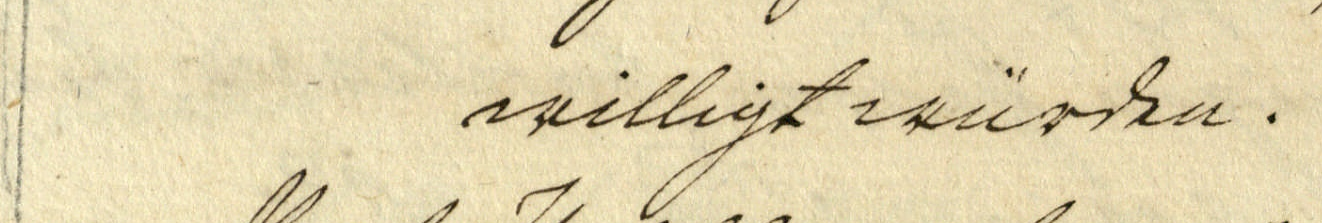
willigt würden.
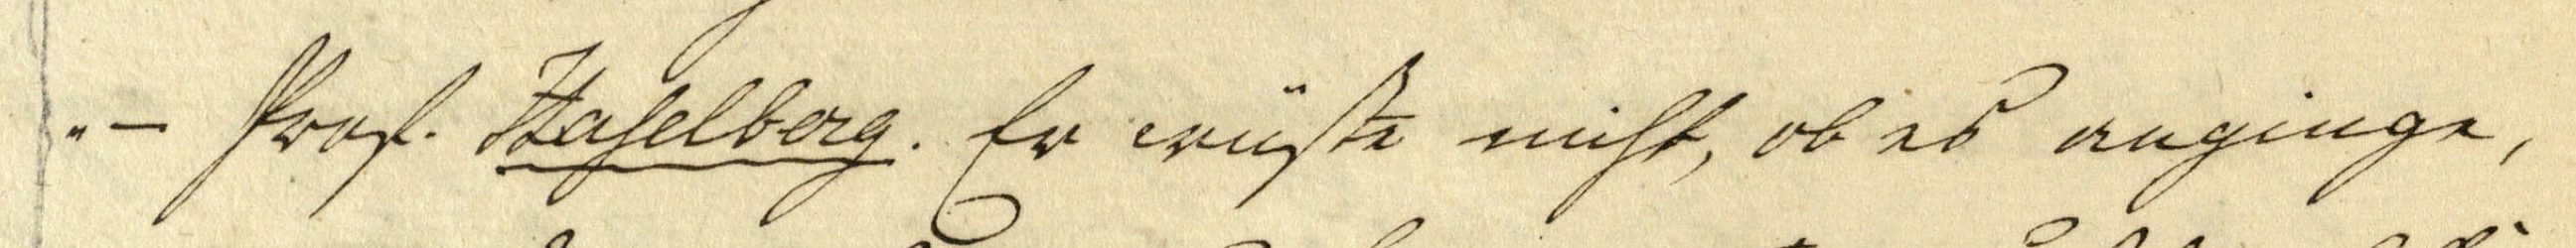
" - Prof. Haselberg. Er wüßte nicht, ob es anginge,
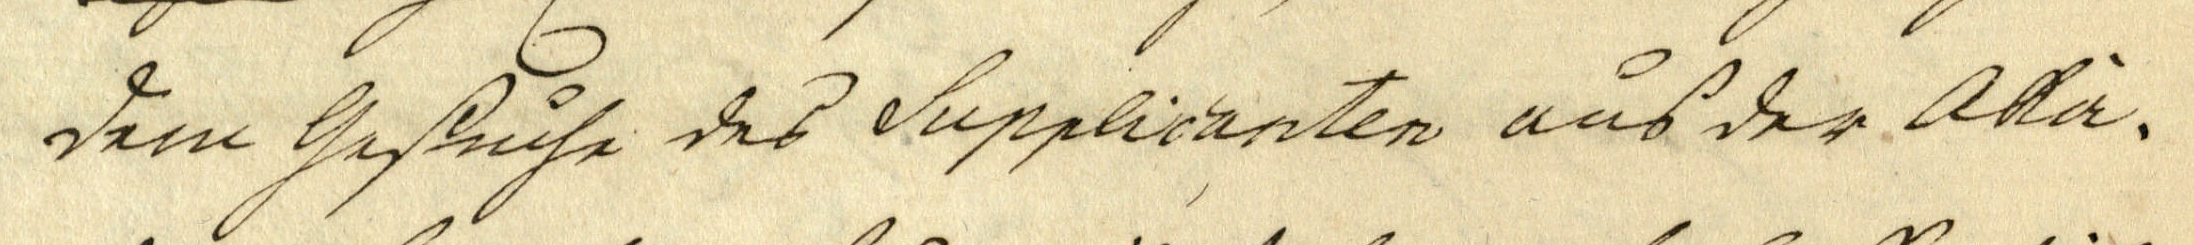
dem Gesuche des Supplicanten aus der Aka-
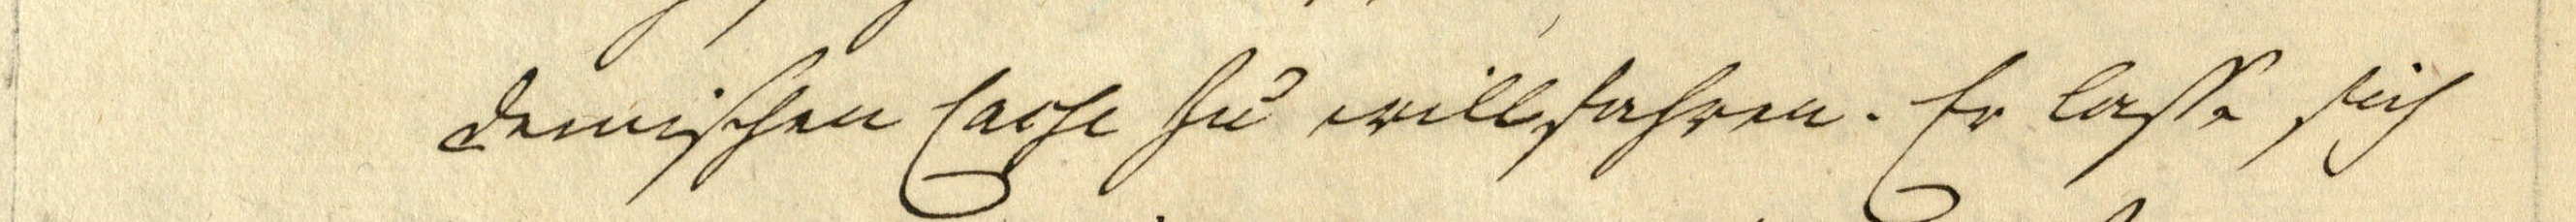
demischen Casse zu willfahren. Er lasse sich
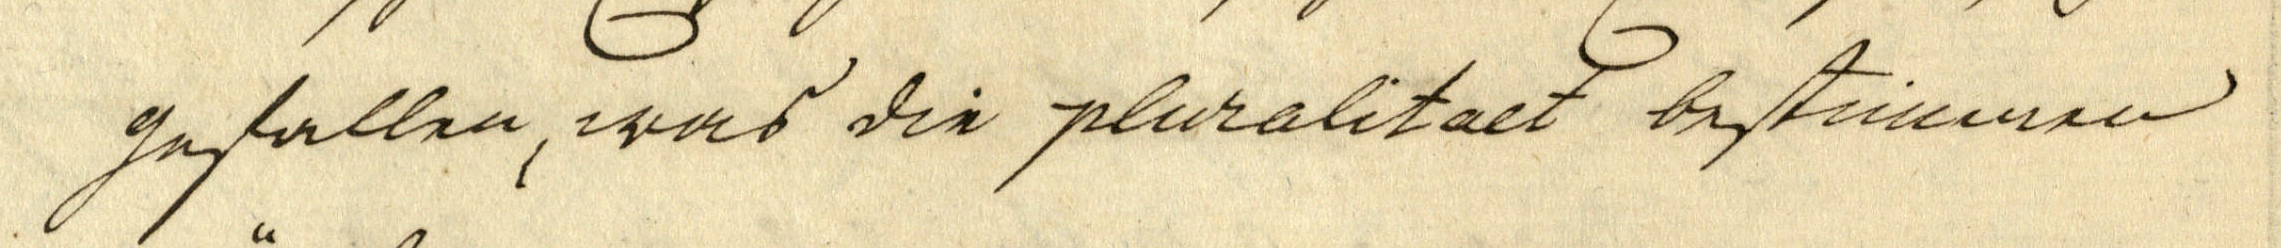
gerfallen, was die pluralitaet bestimmen
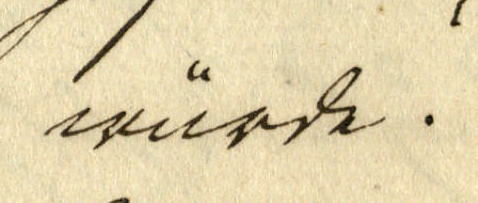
würde
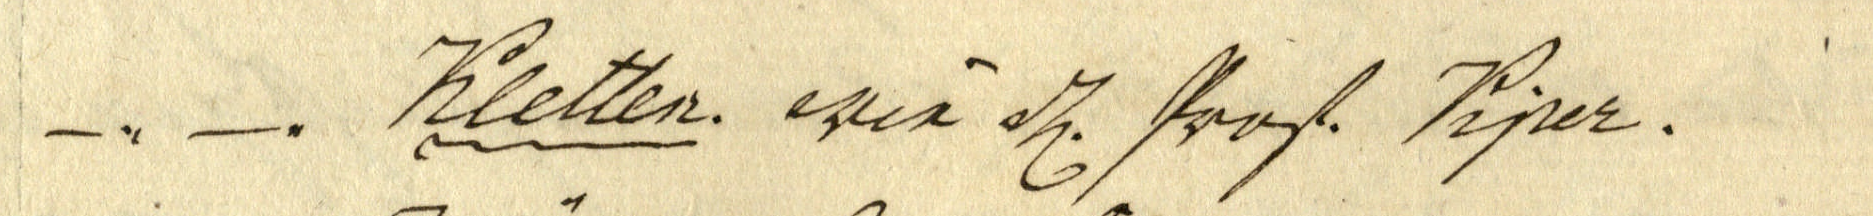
- " - " Kletten. wie dh. Prof. Piper.
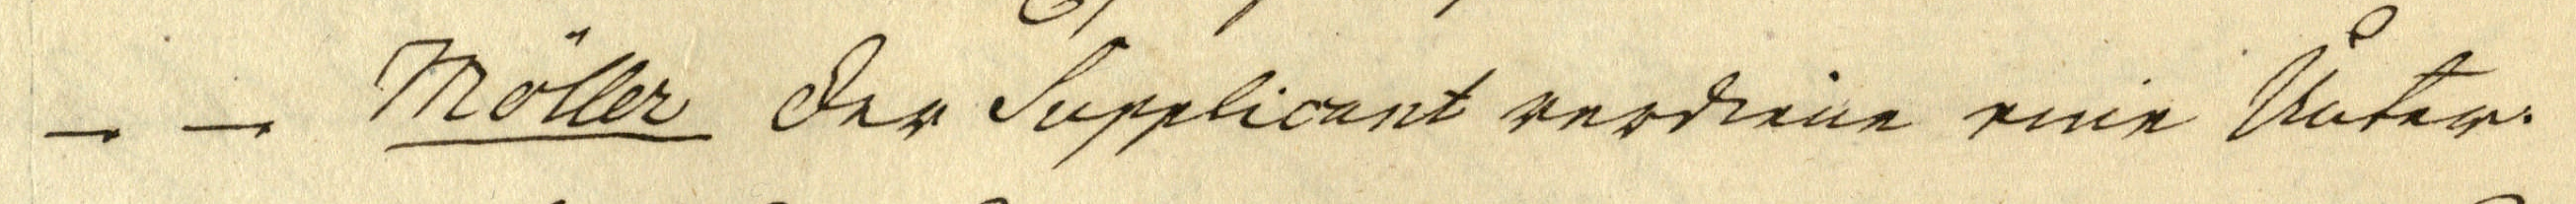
- " - " Möller Der Supplicant verdiene eine Unter-
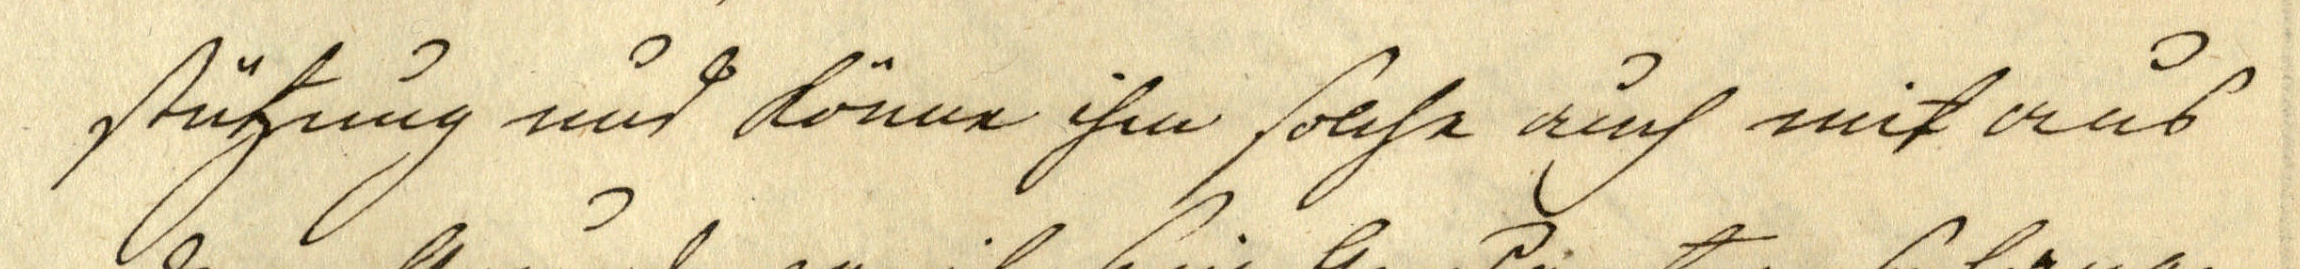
stützung und könne ihm solche auch mit aus
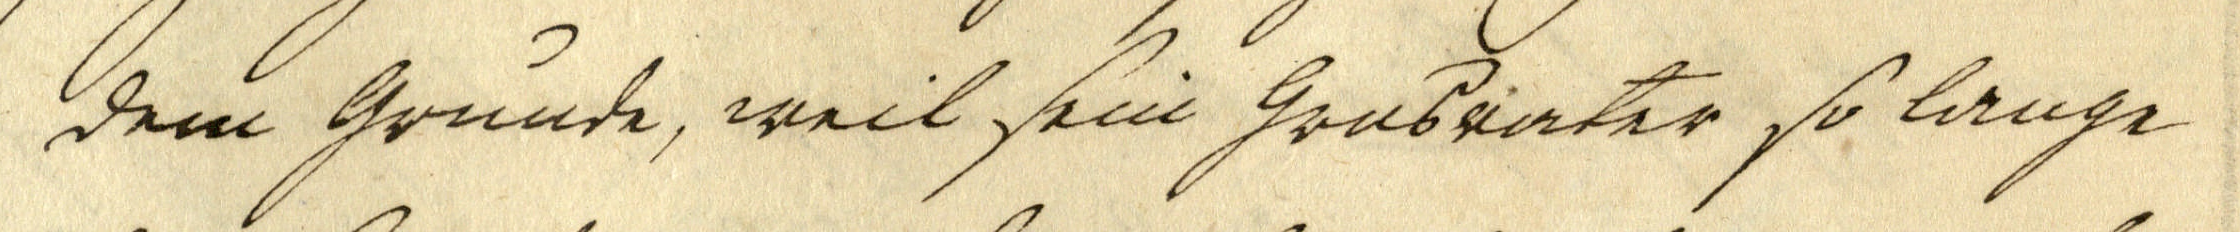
dem Grunde, weil sein Grosvater so lange
